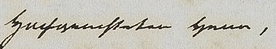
Hochgeachteter Herr,
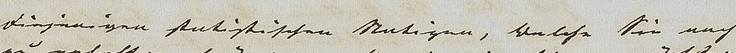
Diejenigen statistischen Notizen, welche Sie noch
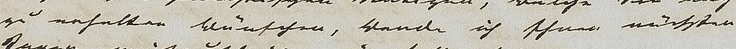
zu erhalten wünschen, werde ich Ihnen nächsten
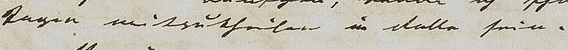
Tagen mitzutheilen im Falle sein.
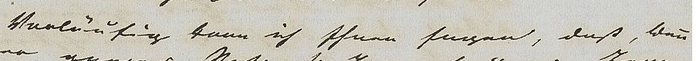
Vorläufig kann ich Ihnen sagen, daß, wenn
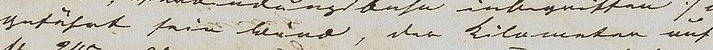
geführt sein wird, der Kilometer auf
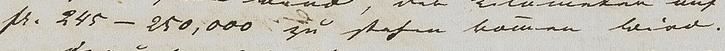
fr. 245–250,000 zu stehen kommen wird.
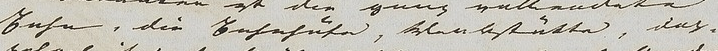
Bahn, die Bahnhöfe, Werkstätte, Dop-
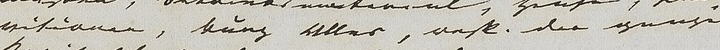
visionen, kurz Alles, resp. der ganze
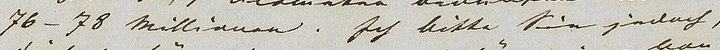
76–78 Millionen. Ich bitte Sie jedoch,
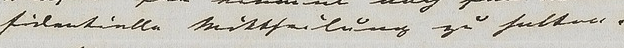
fidentielle Mittheilung zu halten.
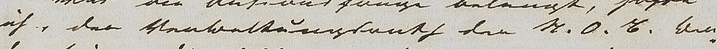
ich, der Verwaltungsrath der N.O.B. wer-
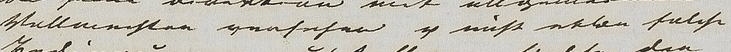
Vollmachten versehen & nicht etwa solche
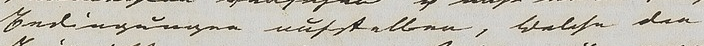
Bedingungen aufstellen, welche den
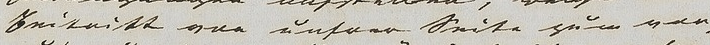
Beitritt von unsrer Seite zum vor-
